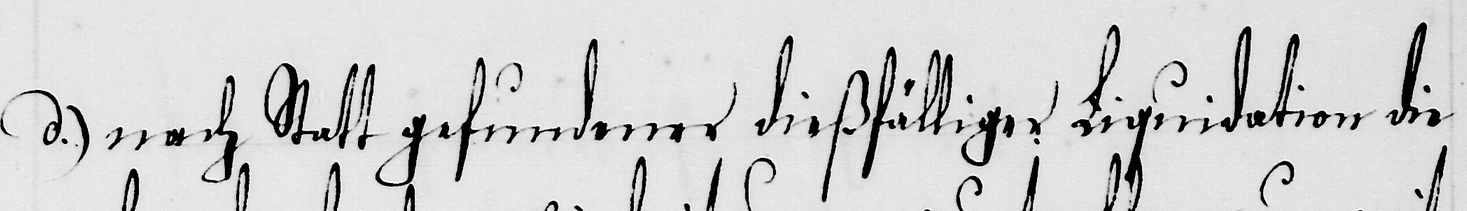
d.) nach Statt gefundener dießfälliger Liquidation die
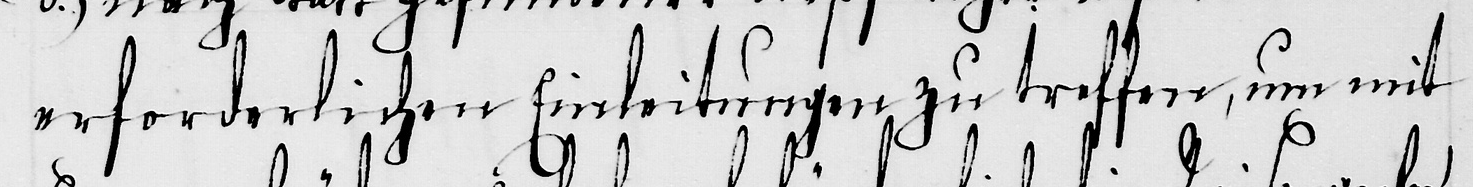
erforderlichen Einleitungen zu treffen, um mit
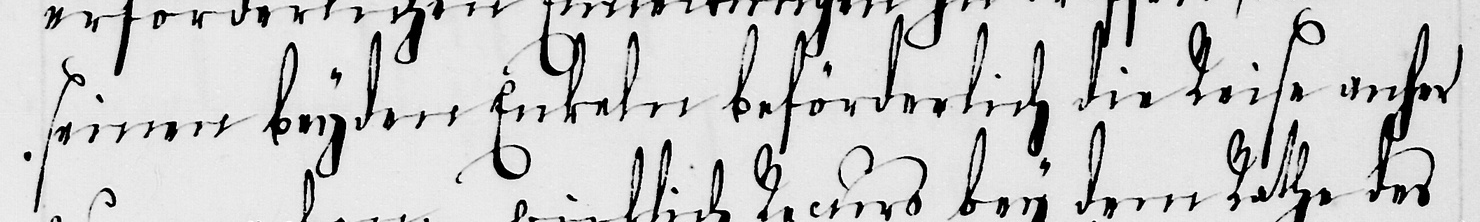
seinen beyden Enkeln beförderlich die Reise anher
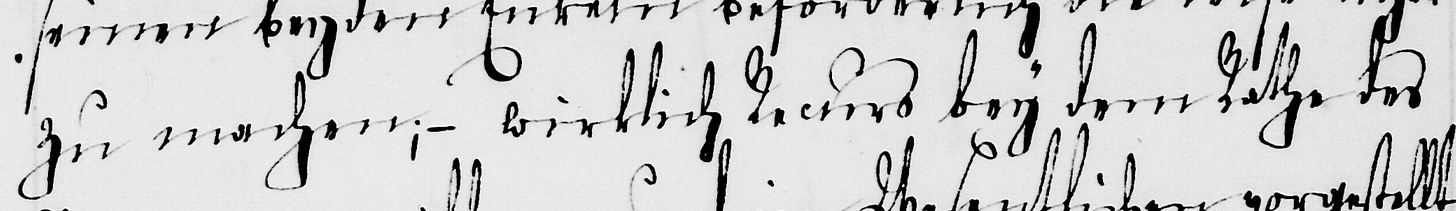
zu machen; – wirklich Recurs bey dem Rathe des
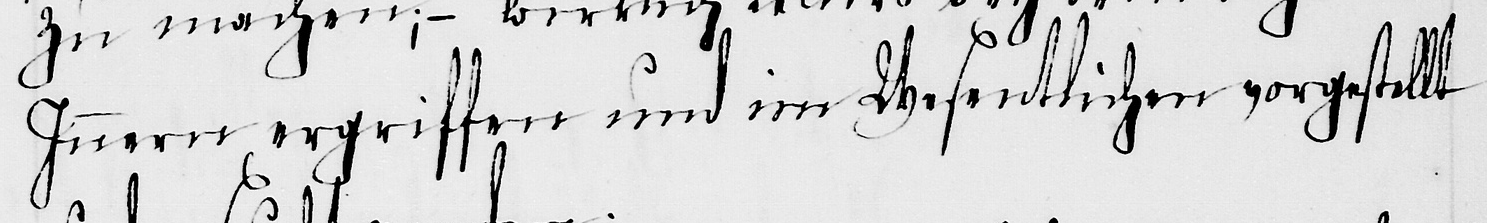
Innern ergriffen und im Wesentlichen vorgestellt
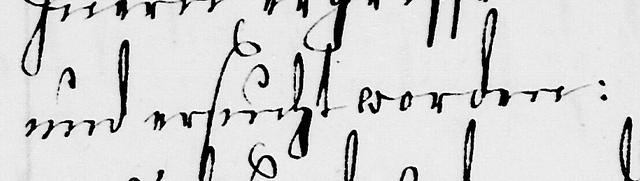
und ersucht worden:
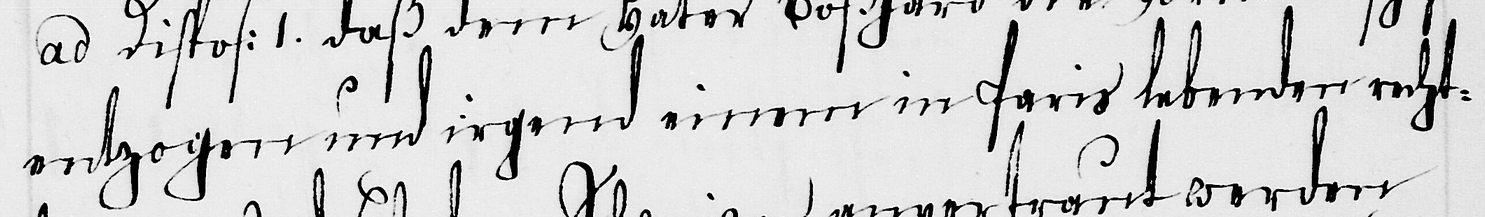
entzogen und irgend einem in Paris lebenden recht¬
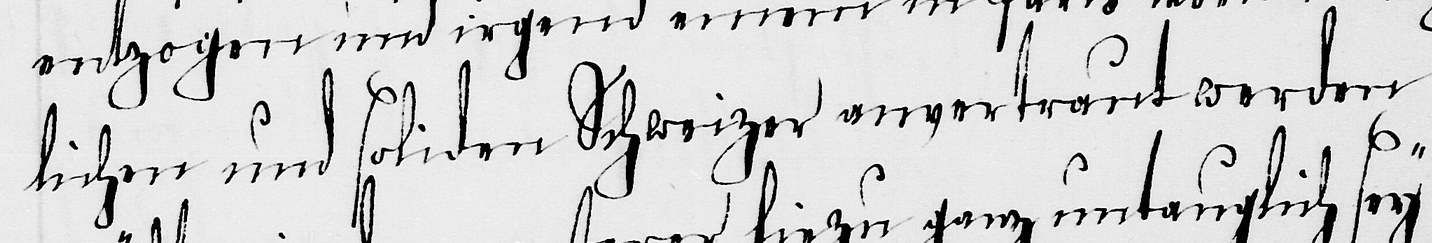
lichen und soliden Schweizer anvertraut werden
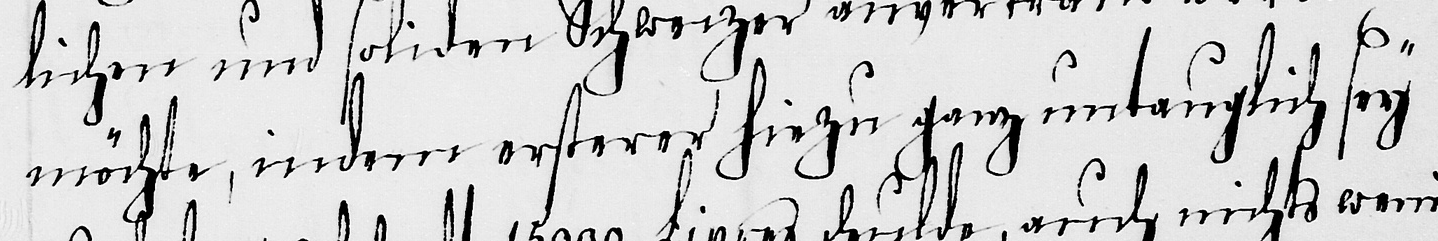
möchte, indem ersterer hiezu ganz untauglich sey
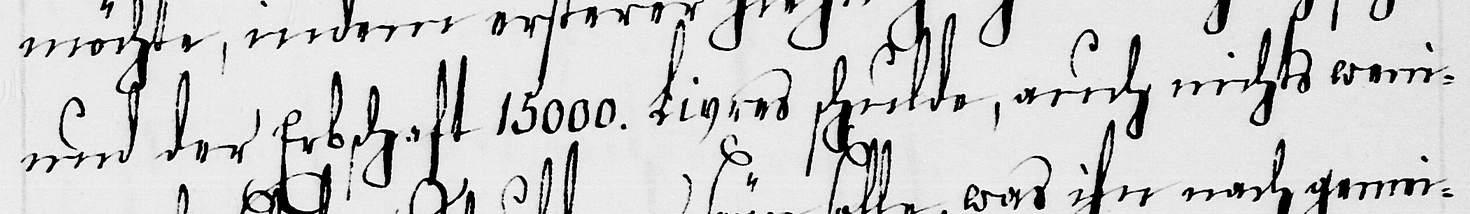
und der Erbschaft 15000. Livres schulde, auch nichts wen¬
